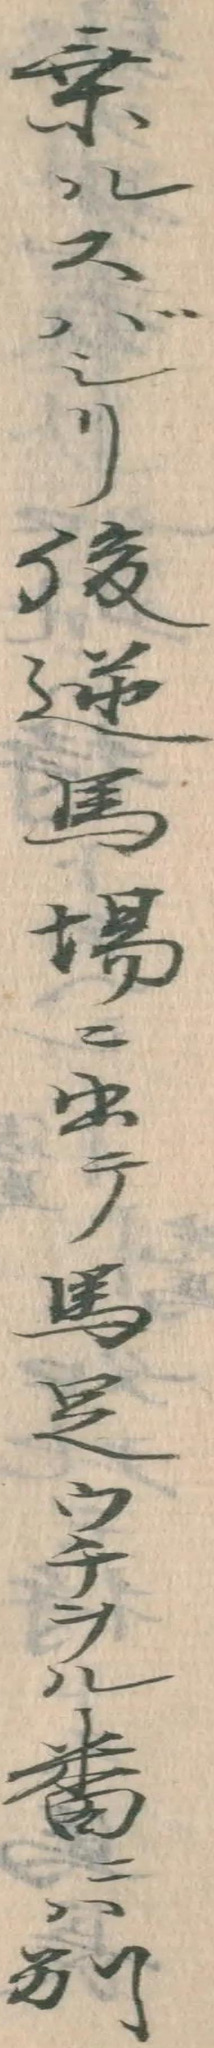乗ルスバシリ後逆馬場ニ出テ馬足ウチヲル番ニハ別
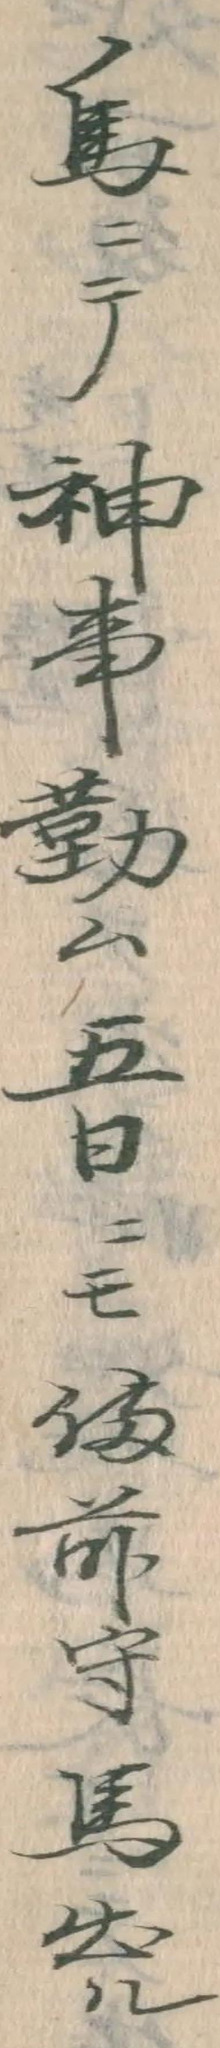ノ馬ニテ神事勤ム五日ニモ備前守馬出ル
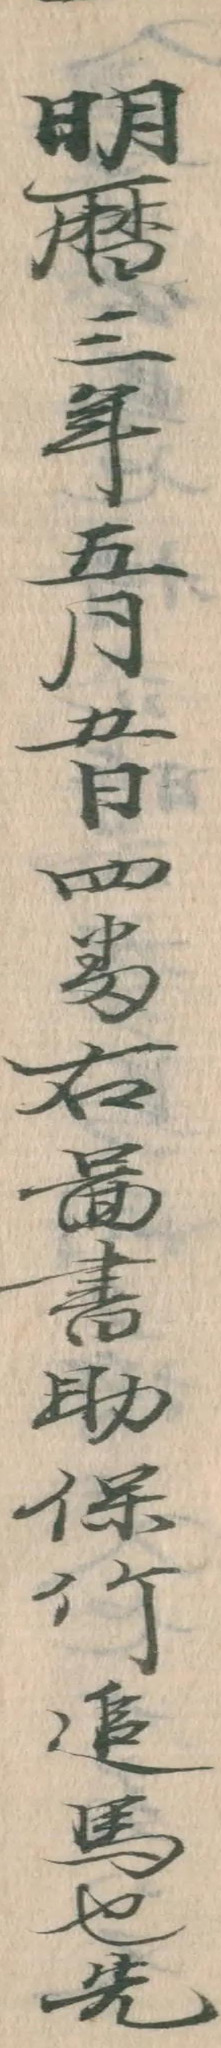一明暦三年五月五日四番右図書助保竹追馬也先
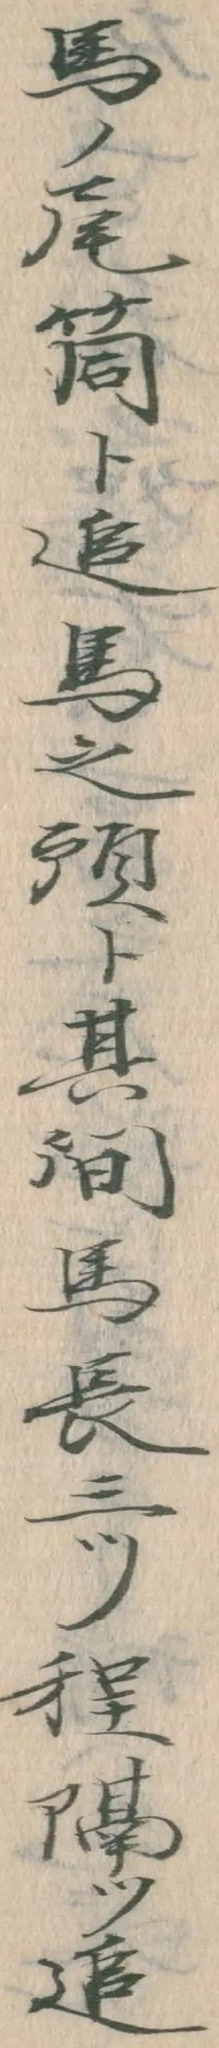馬ノ尾筒ト追馬之頭ト其間馬長三ツ程隔ツ追
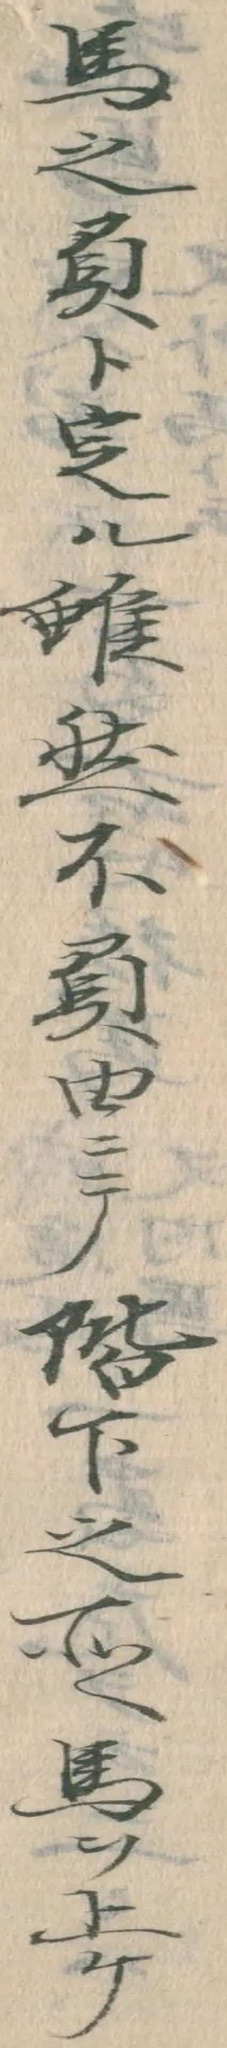馬之負ト定ル雖然不負由ニテ階下之所へ馬ヲ上ケ
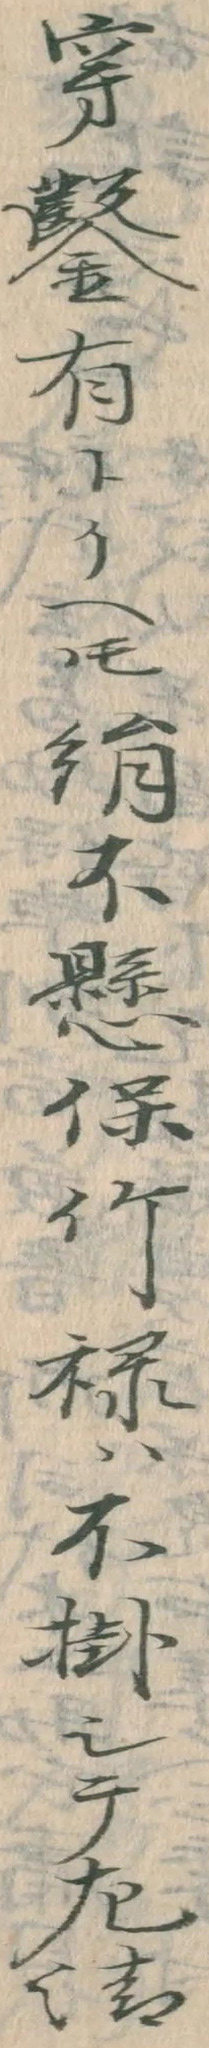穿鑿有トリイヘトモ絹不懸保竹禄ハ不掛シテ左清
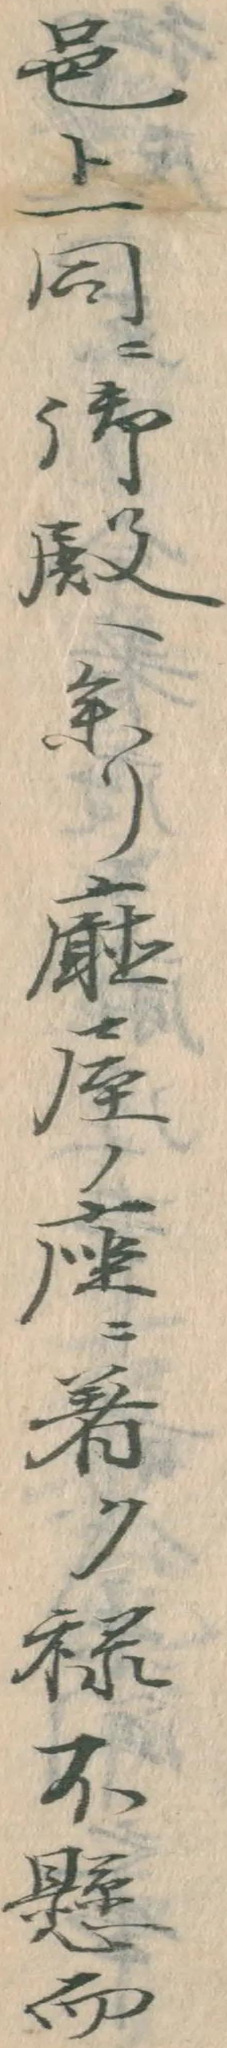邑ト一同ニ御殿へ参り庁屋ノ座ニ着ク禄不懸而

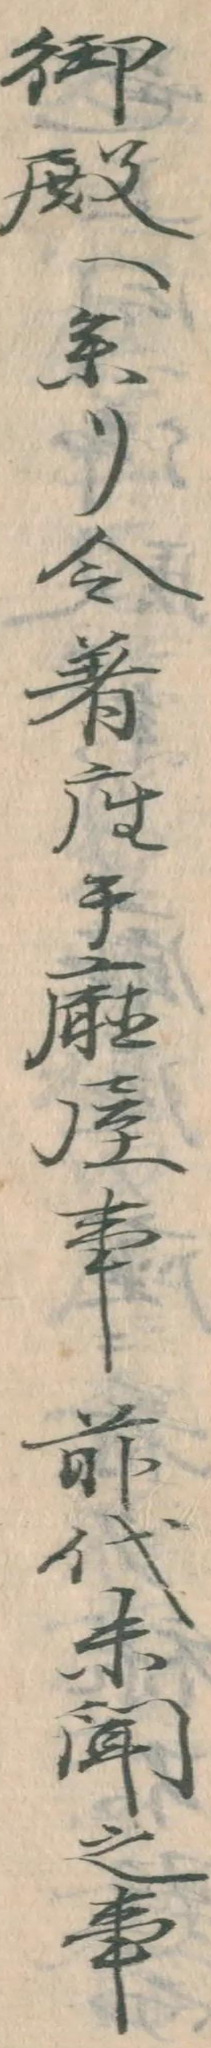御殿へ参リ令着座于庁屋事前代未聞之事
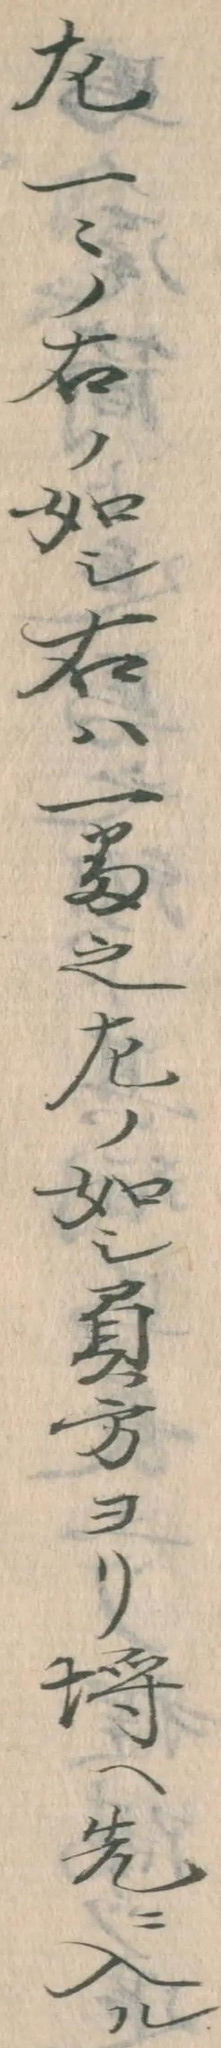左一々ノ右ノ如シ右ハ一番之左ノ如シ負方ヨリ埒へ先ニ入ル
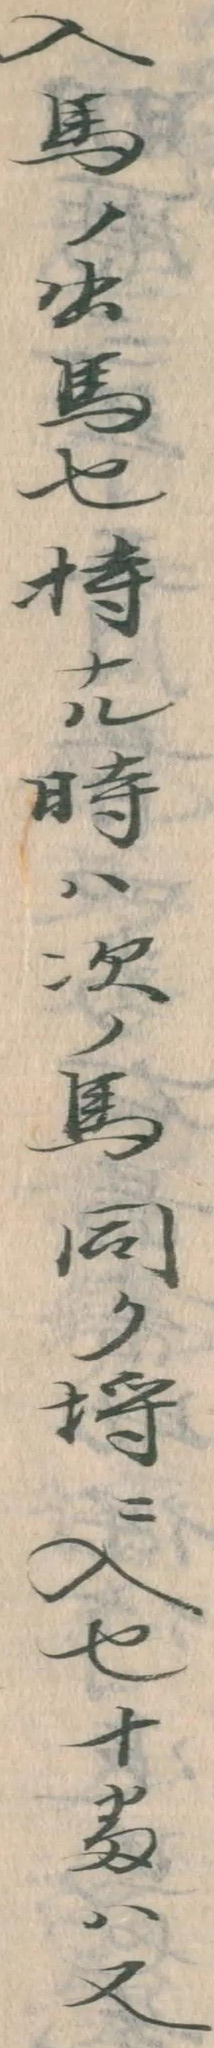入馬ノ出馬也持ナル時ハ次ノ馬同ク埒ニ入也十番ハ又
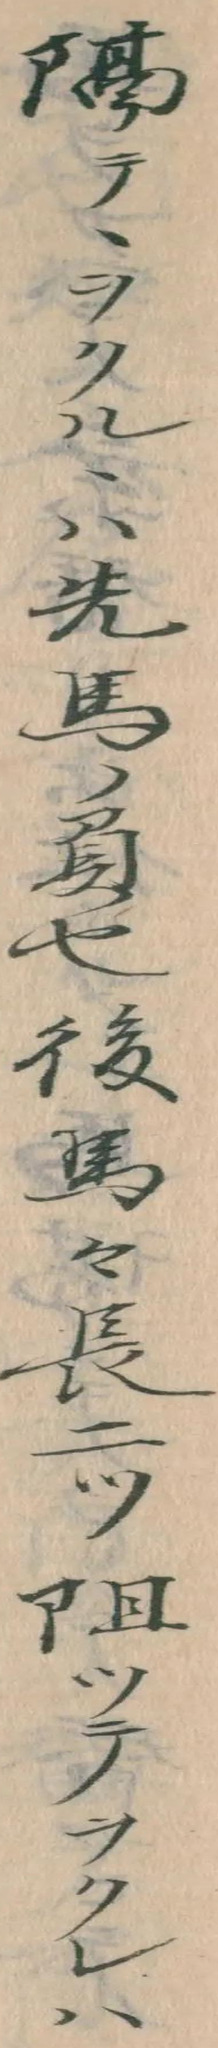隔テヽヲクルヽハ先馬ノ負也後馬々長二ツ阻ツテヲクレハ
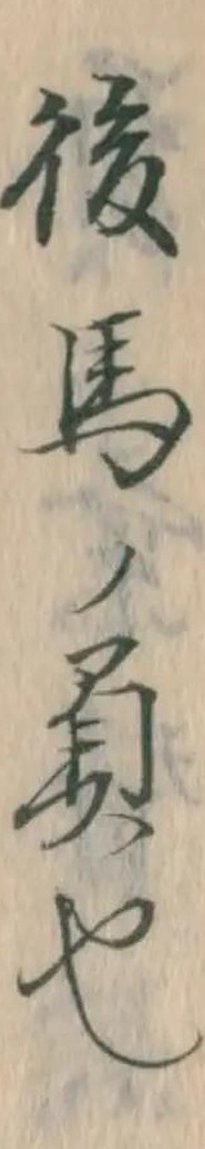後馬ノ負也
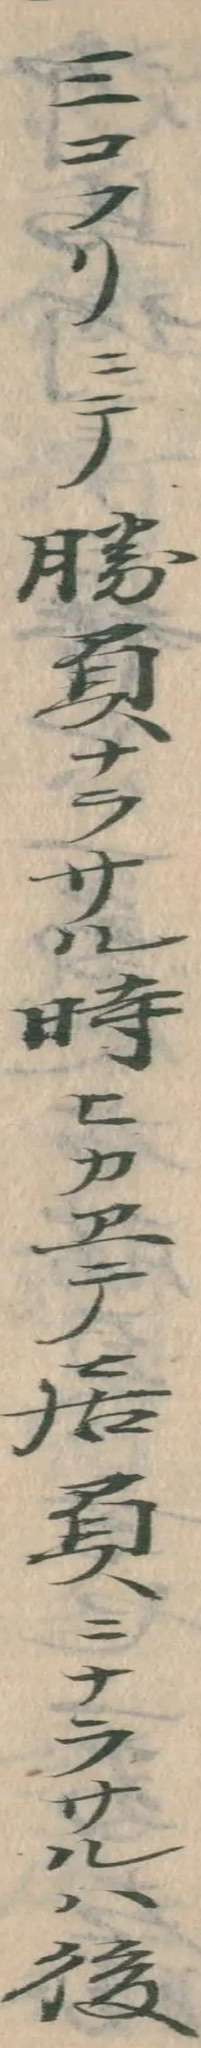一三コフリニテ勝負ナラサル時ヒカヱテ居負ニナラサルハ後
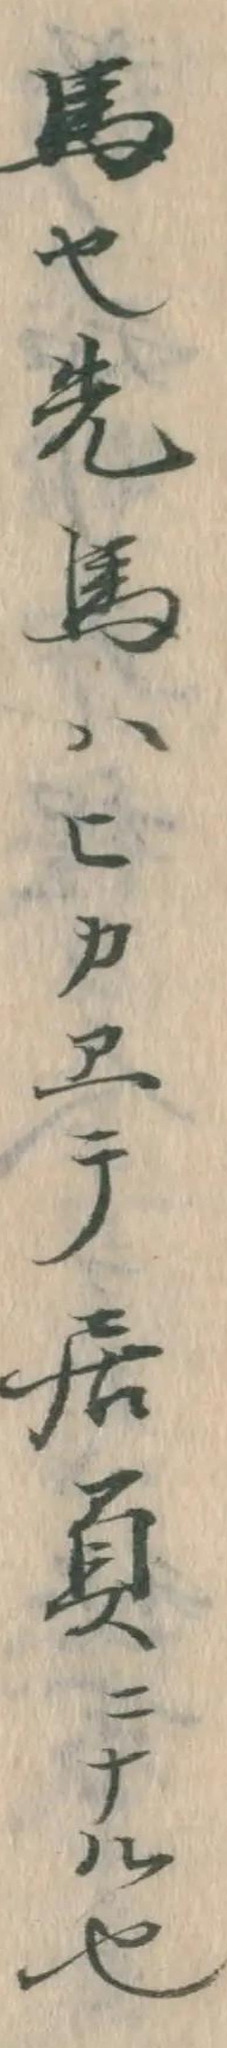馬也先馬ハヒカヱテ居負ニナル也
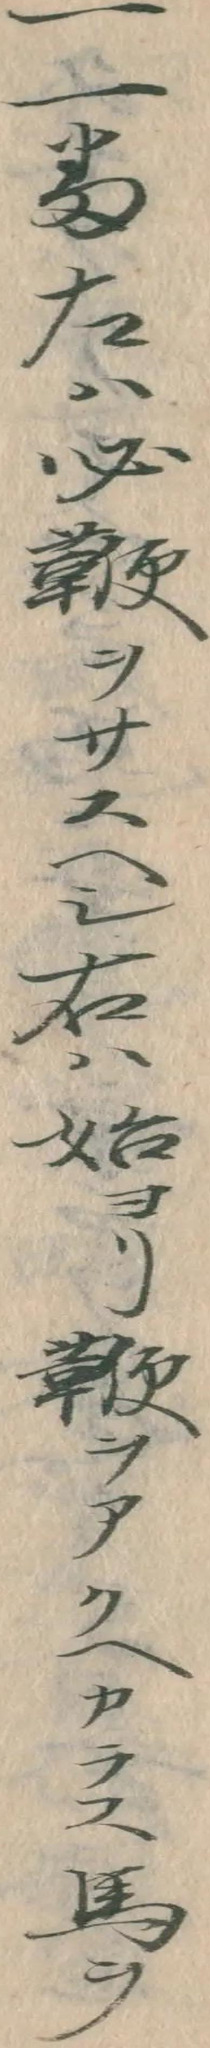一一番左ハ必鞭ヲサスヘシ右ハ始ヨリ鞭ヲアクヘカラス馬ヲ
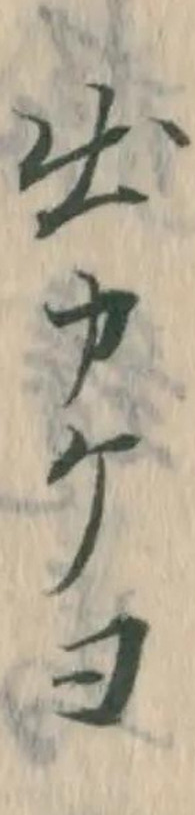出カケヨ
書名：賀茂社記録. 第11冊
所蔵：国立国会図書館 National Diet Library, JAPAN
